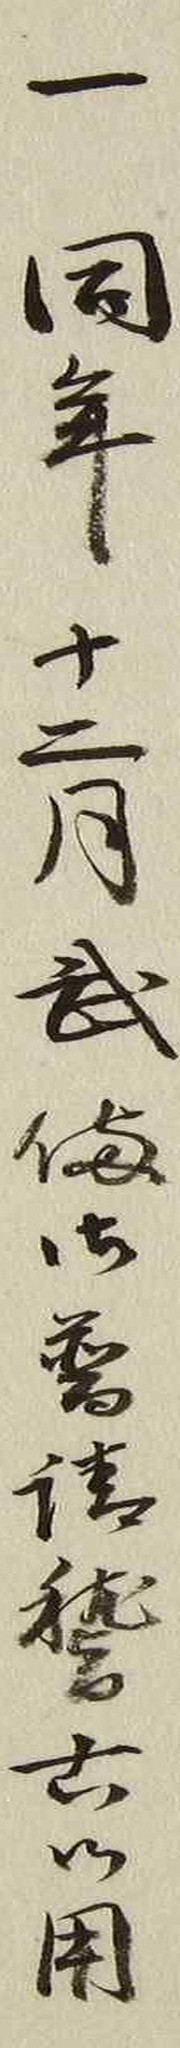一同年十二月武備御普請稽古御用
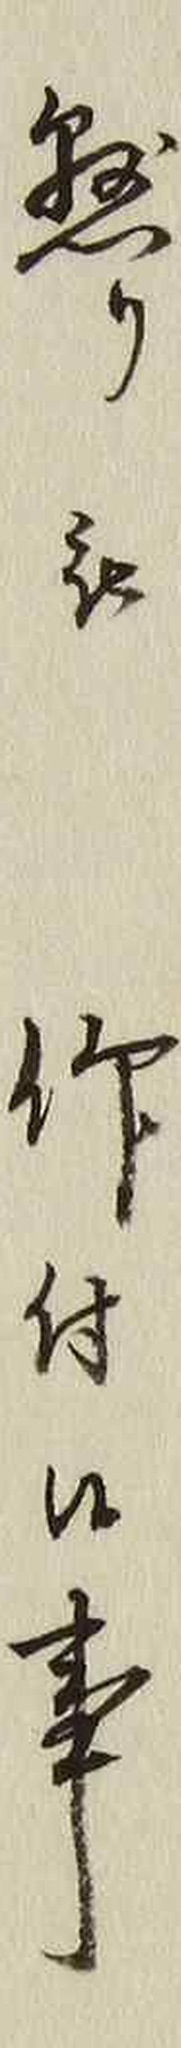懸り被仰付候事
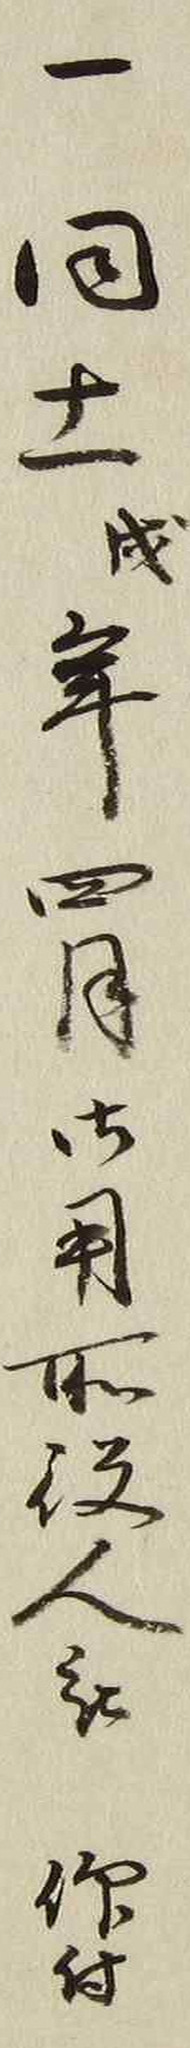一同十一戌年四月御用所役人被仰付
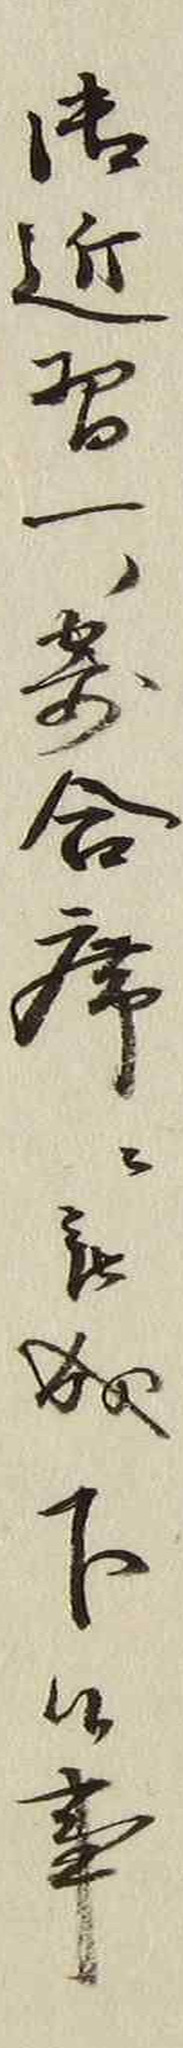御近習一ノ寄合席ニ被成下候事
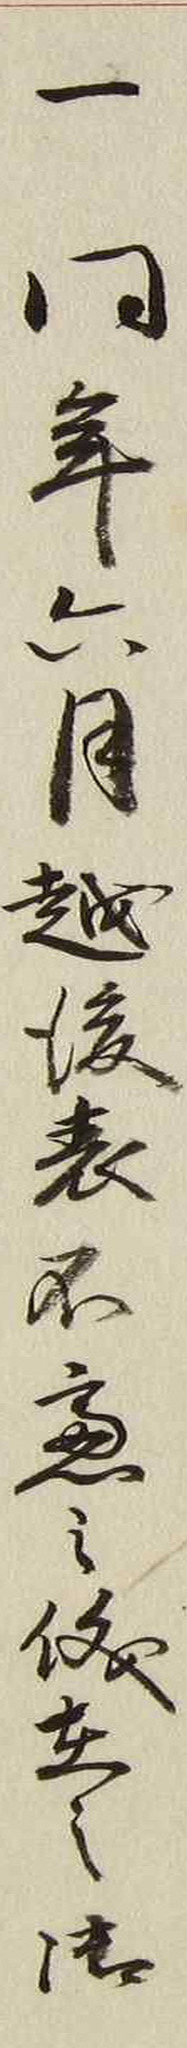一同年六月越後表不慮之儀在之御
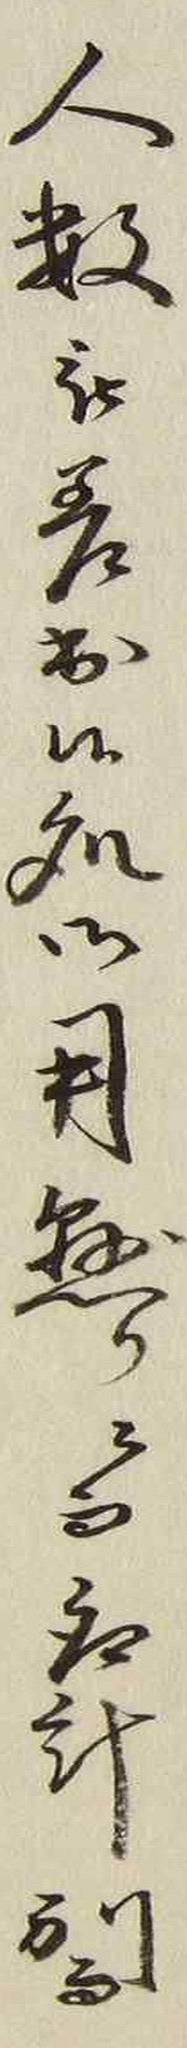人数被差出候処御用懸りニ而取計別而
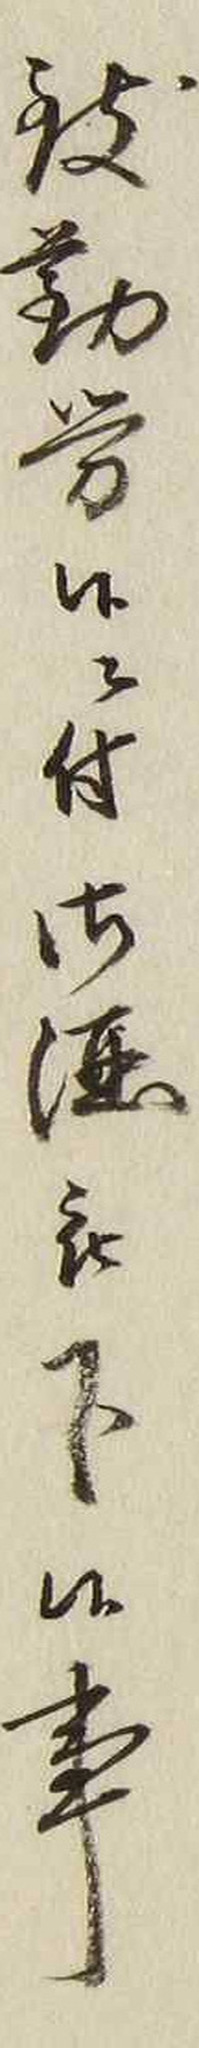致勤労候ニ付御酒被下候事

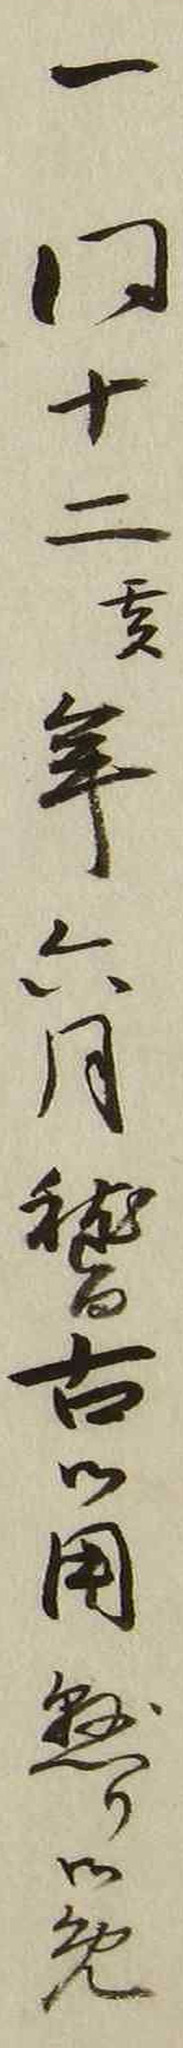一同十二亥年六月稽古御用懸り御免
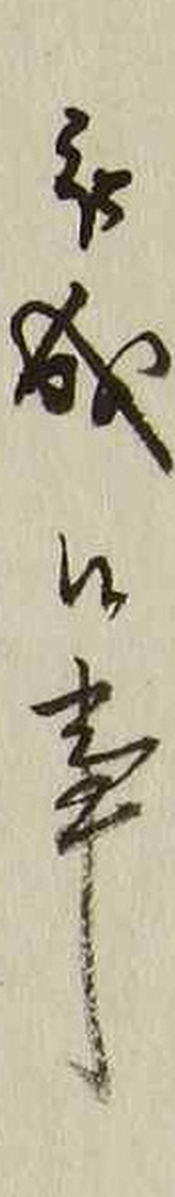被成候事
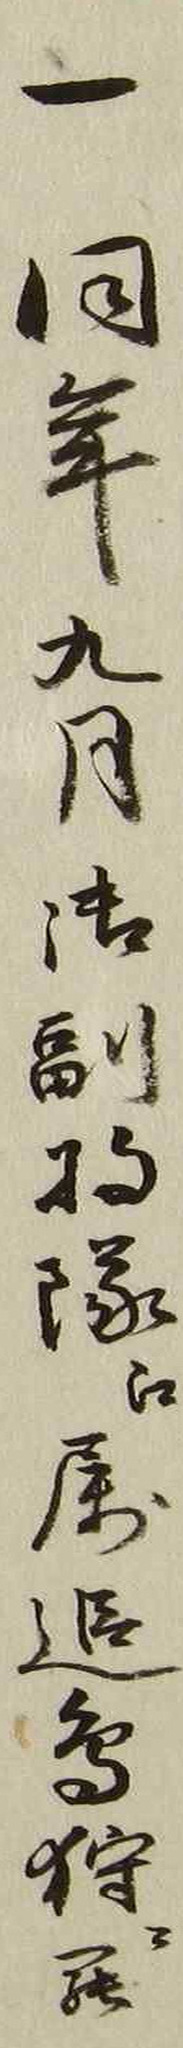一同年九月御副将隊江属追鳥狩ニ罷
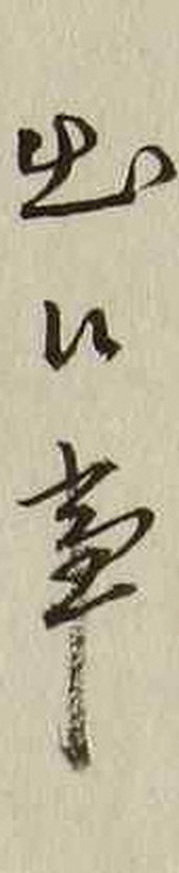出候事
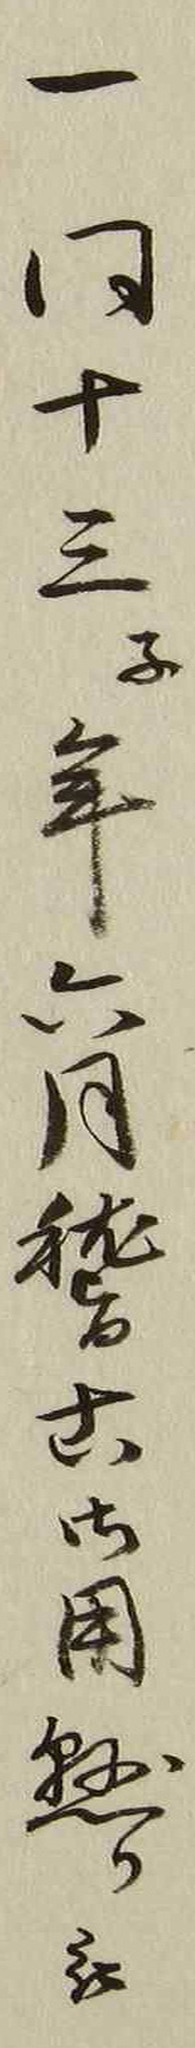一同十三子年六月稽古御用懸り被
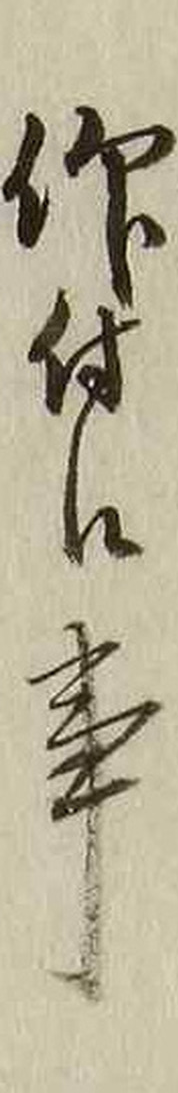仰付候事
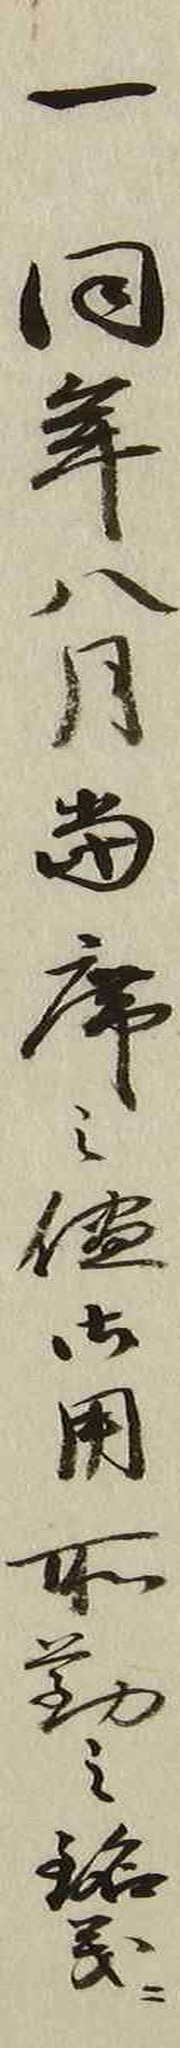一同年八月当席之儘御用所勤之銘義ニ
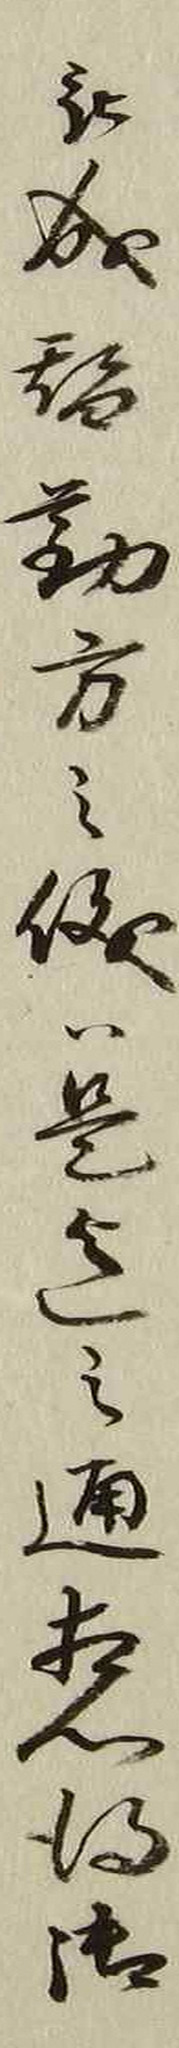被成替勤方之儀ハ是迄之通心得御
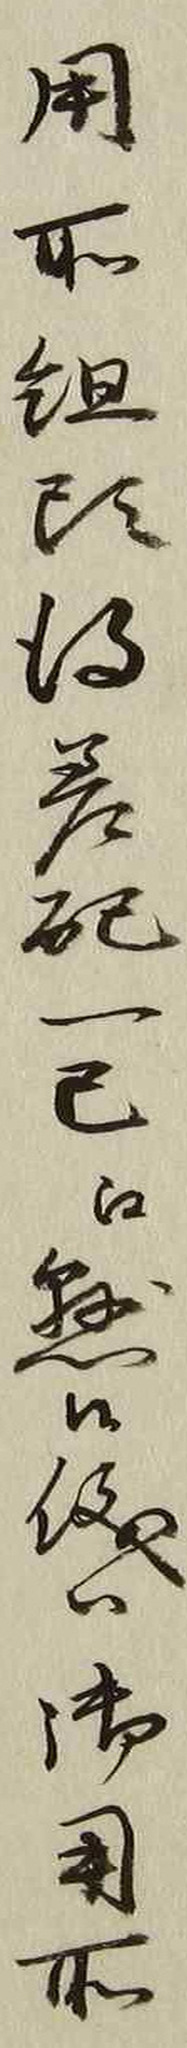用所組頭得差配一己江懸候儀ハ御用所
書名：諸士系譜　巻之149　そ之部2
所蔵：会津若松市立会津図書館
